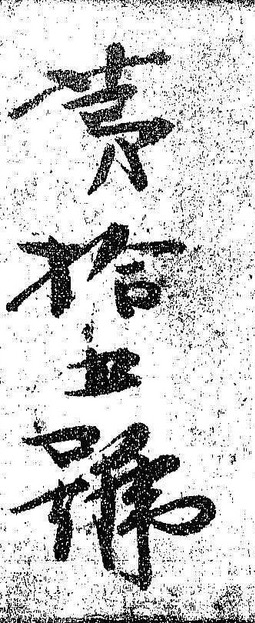第拾五号
